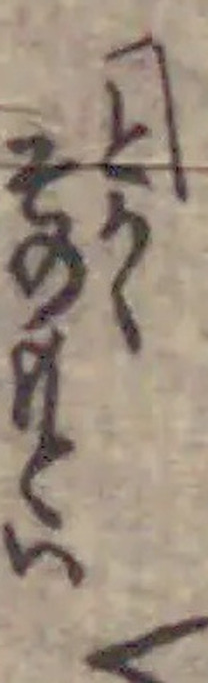そのもとは
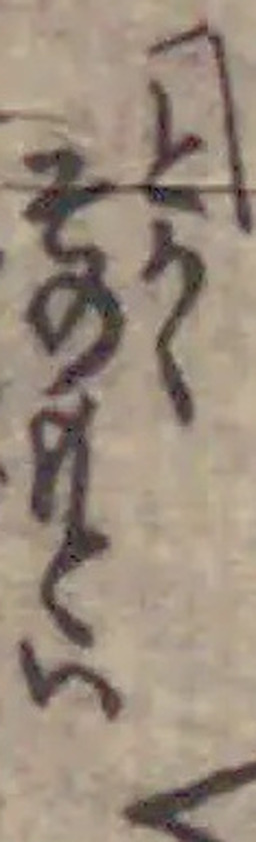そのもとは
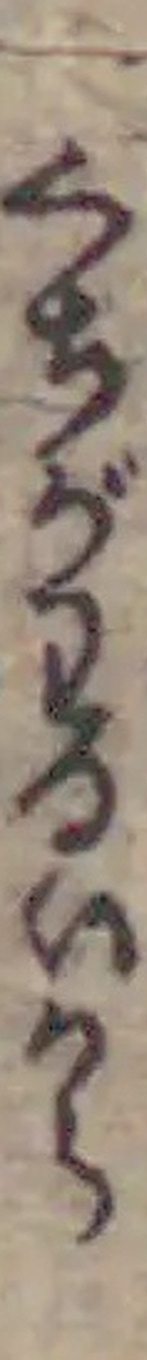くちがわるいから
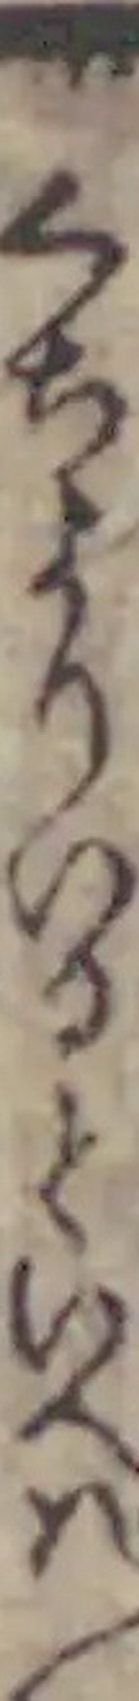くちよりいるといへば
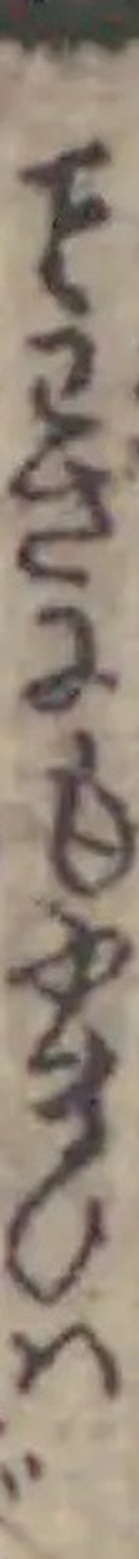ことわさにもやまひは
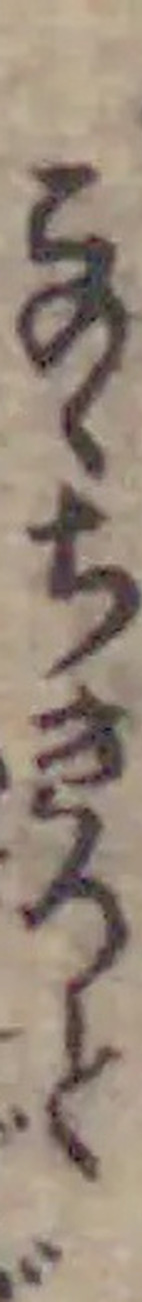このくちきつと
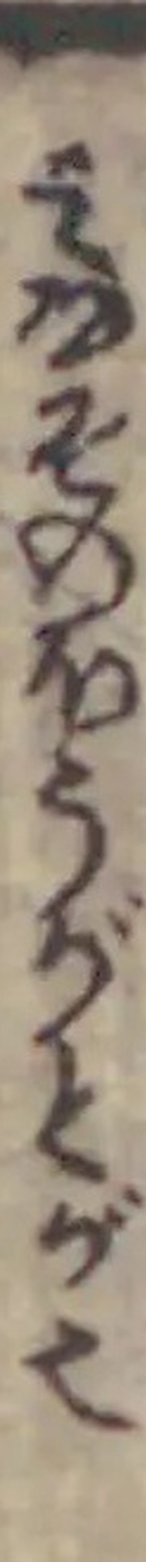みなそのほうがとが也
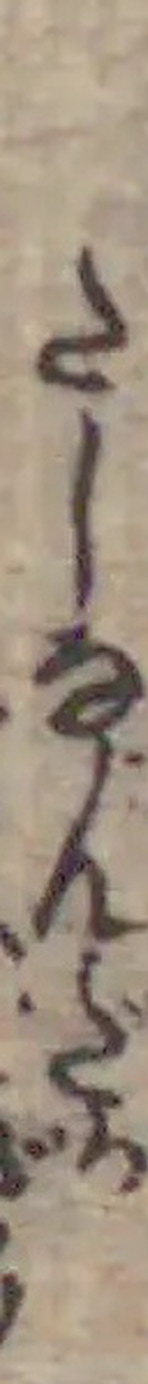たしなんだが
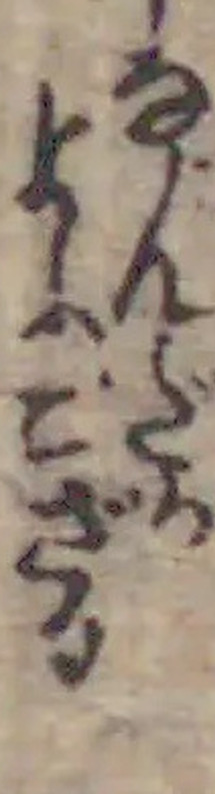よふござる
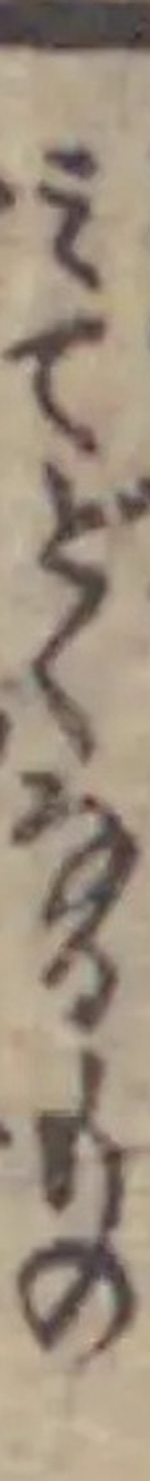みてどくなるもの
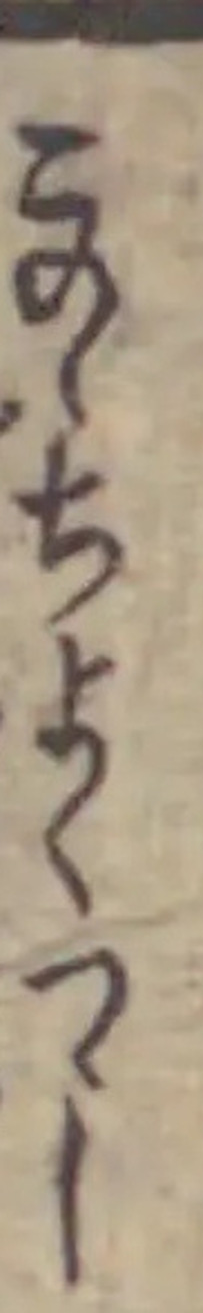このゝちよくつゝし
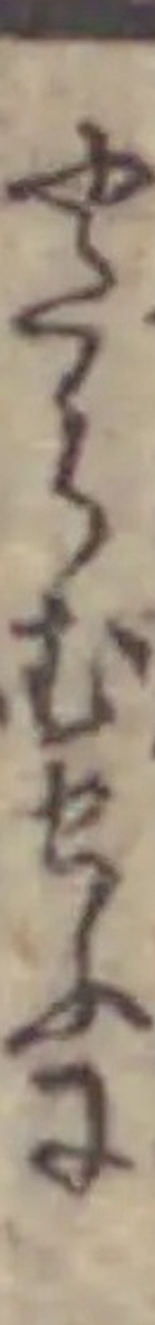やたらむせふに
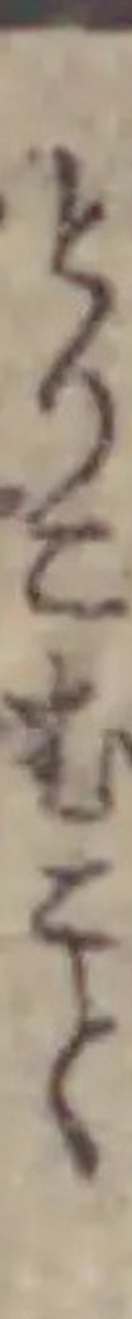とりこむこと
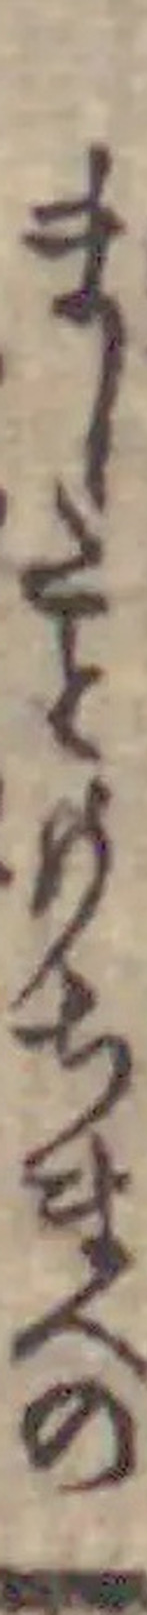ましたともちまへの
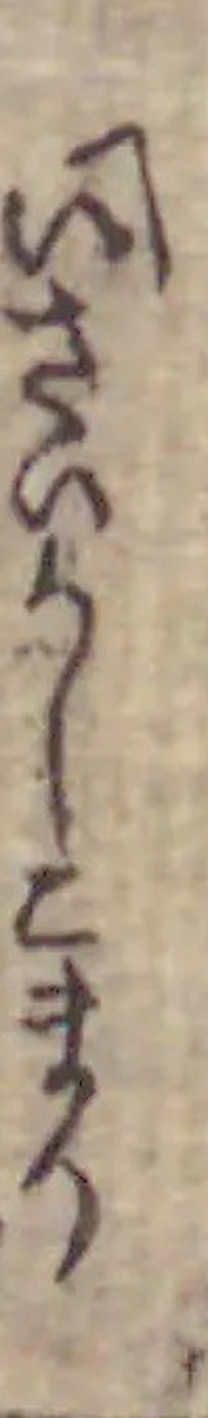〽いさいかしこまり
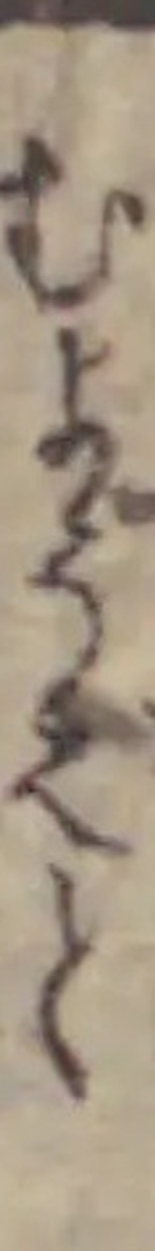むよう也と
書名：腹内養生主論 3巻
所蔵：国立国会図書館 National Diet Library, JAPAN
